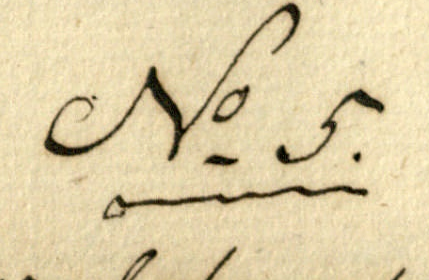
No 5.
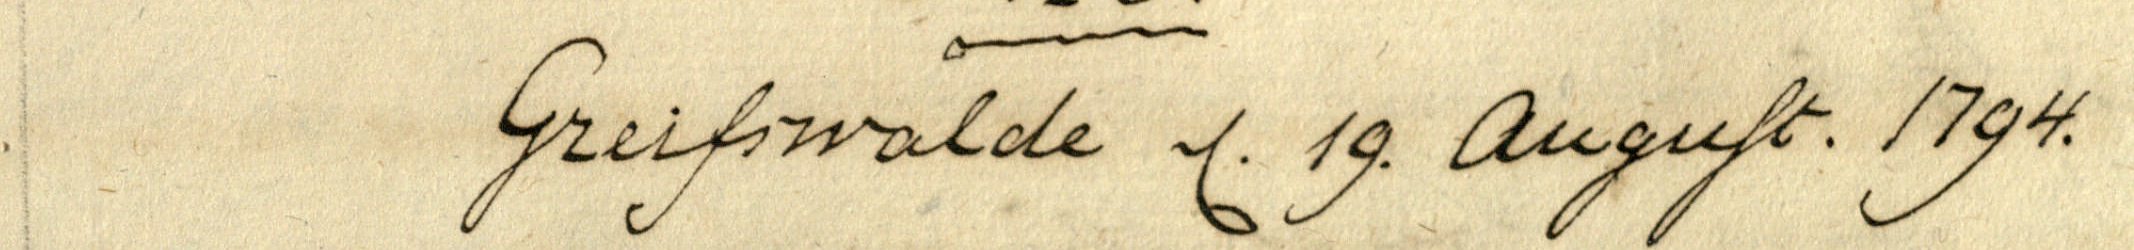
Greifswalde d. 19. August. 1794.
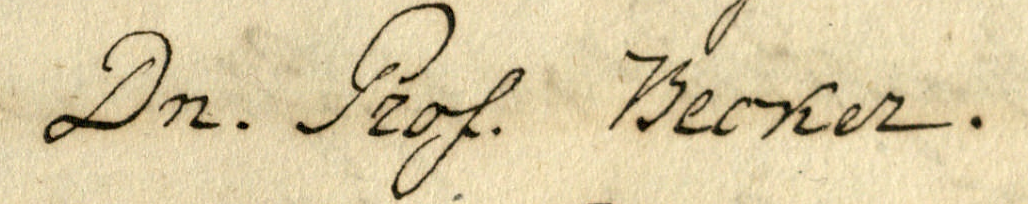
Dn. Prof. Becker.
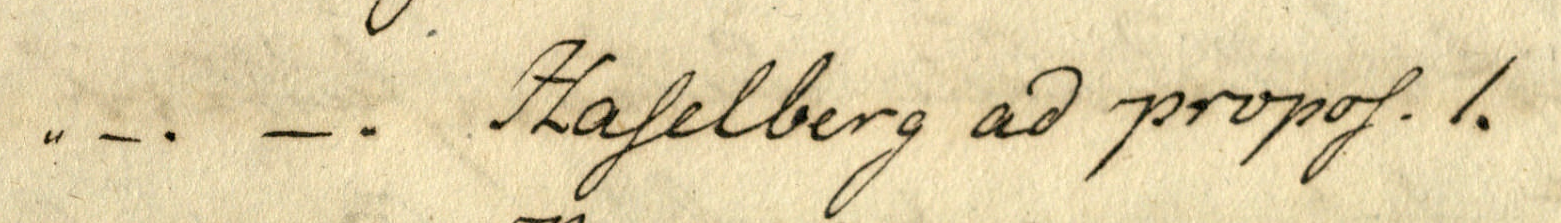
" - . - . Haselberg ad propos. 1.
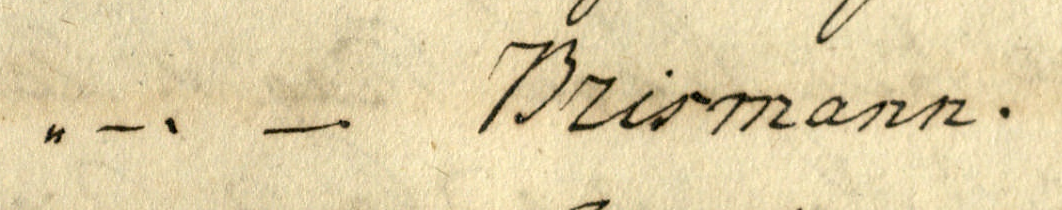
" - . - . Brismann.
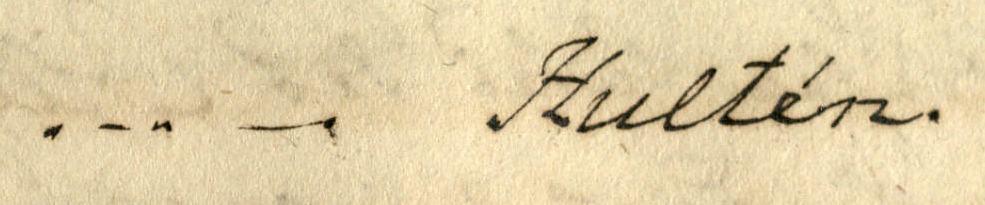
" - " - . Hultén.
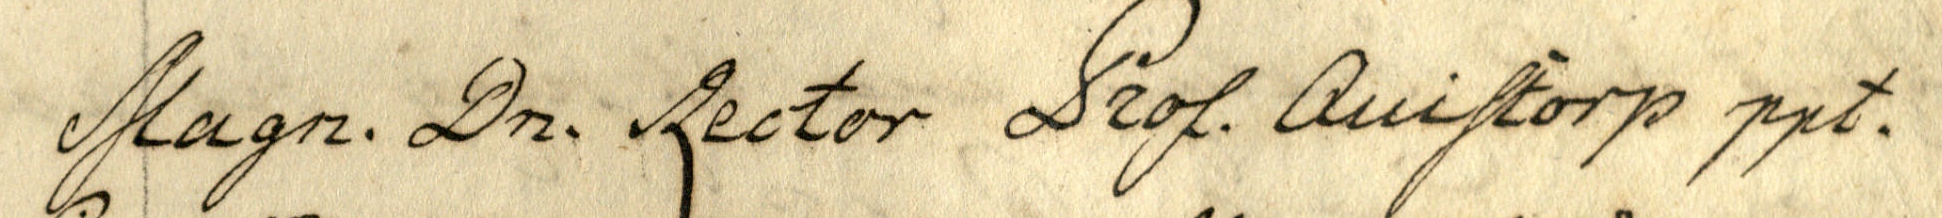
Magn. Dn. Rector Prof. Quistorp ppt.
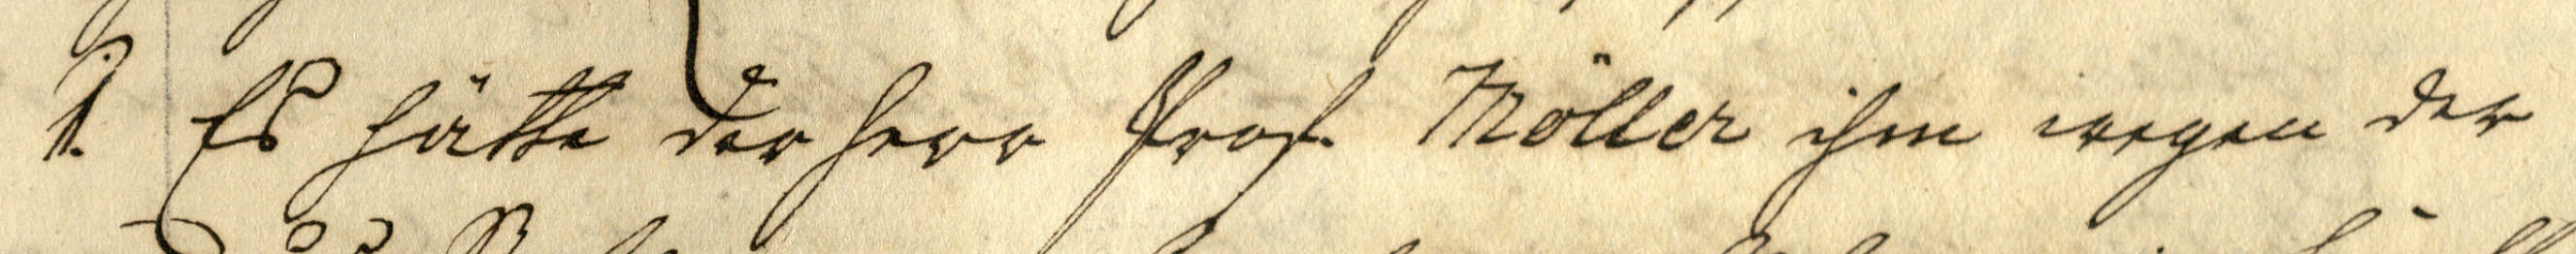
1. Es hätte der Herr Prof. Möller ihm wegen der
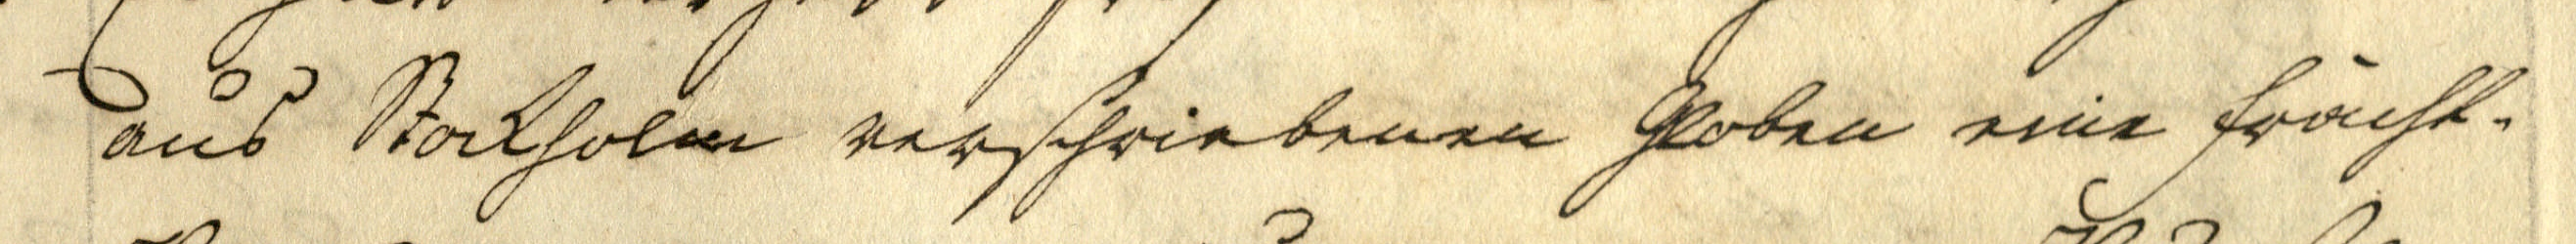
aus Stockholm verschriebenen Globen eine Fracht-
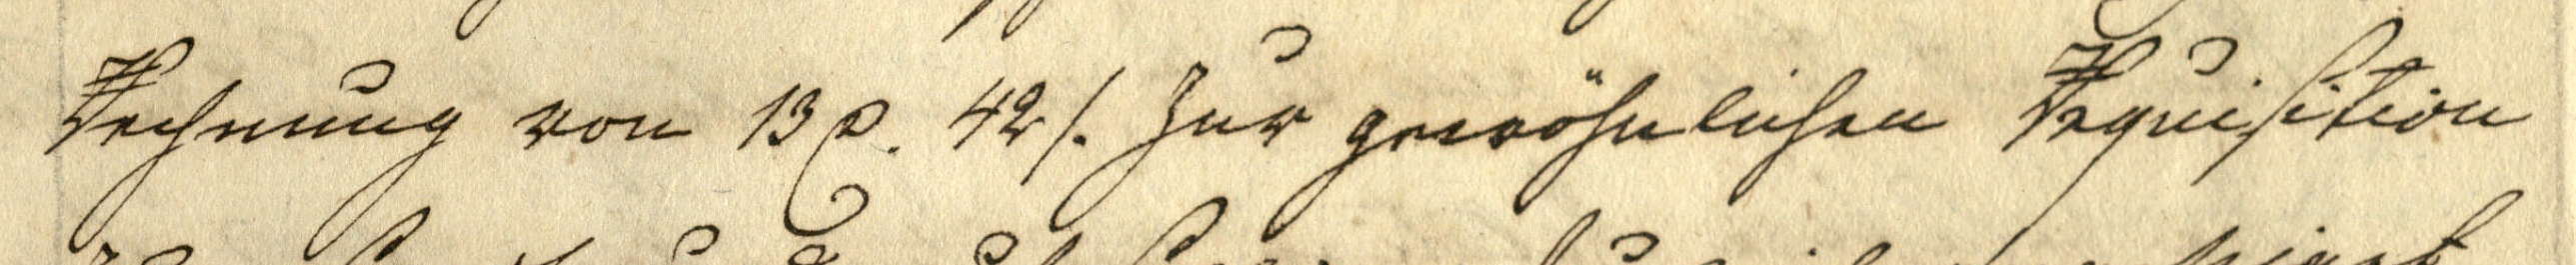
Rechnung von 13 rtl. 42 s. zur gewöhnlichen Requisition
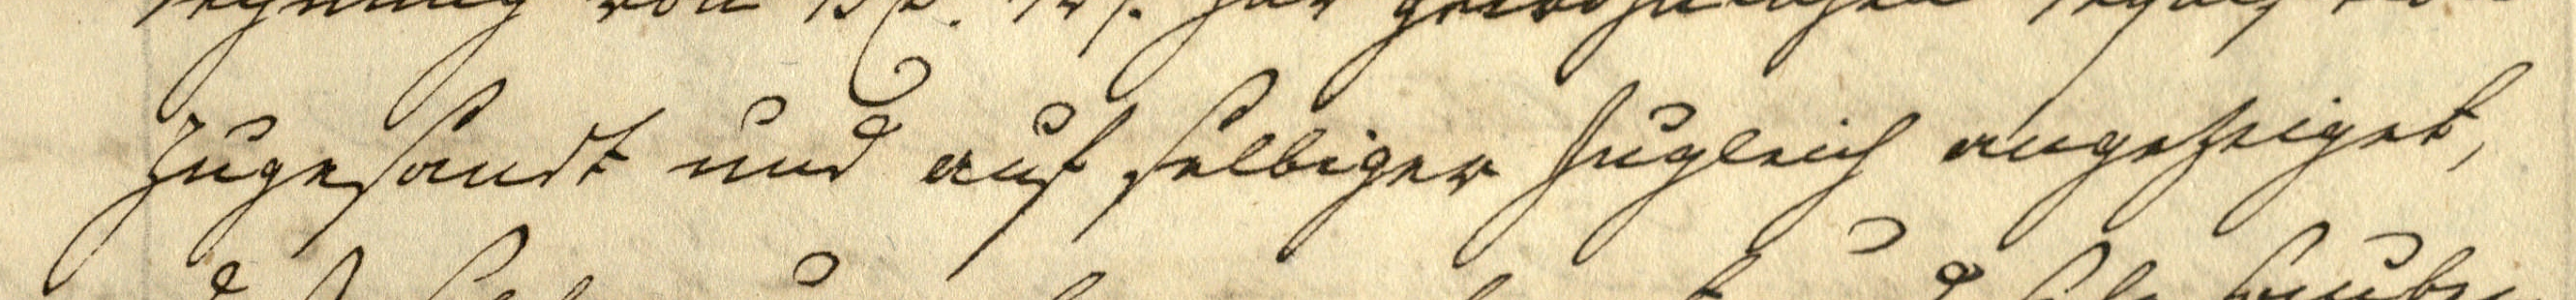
zugesandt und auf selbiger zugleich angezeiget,
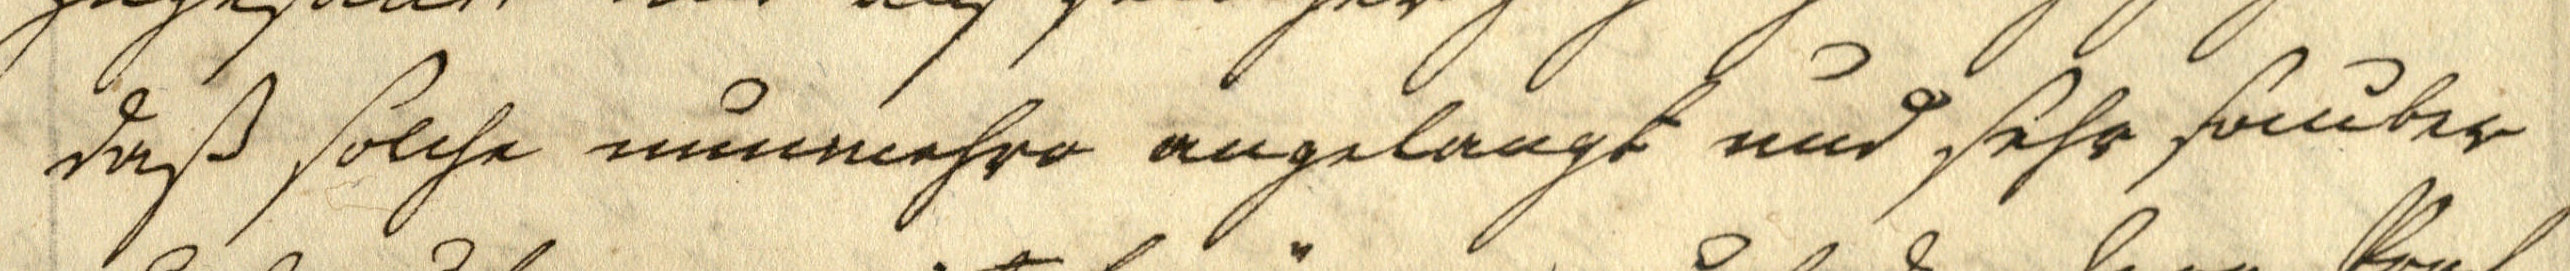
daß solche nunmehro angelangt und sehr sauber
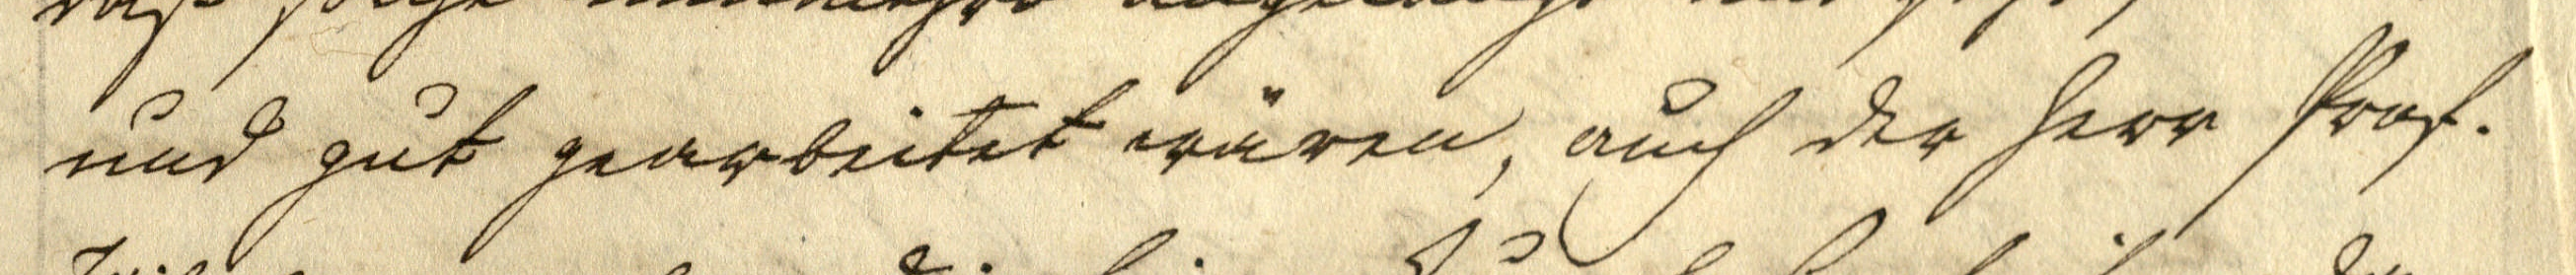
und gut gearbeitet wären, auch der Herr Prof.
